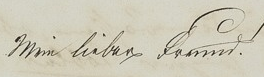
Mein lieber Freund!
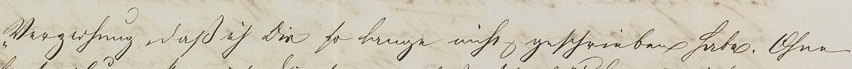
Verzeihung, daß ich Dir so lange nicht geschrieben habe. Ohne
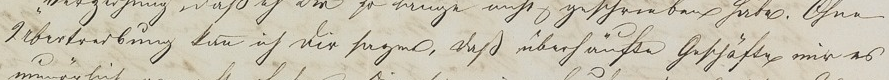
Übertreibung kann ich Dir sagen, daß überhäufte Geschäfte mir es
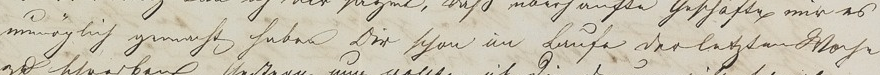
unmöglich gemacht haben Dir schon im Laufe der letzten Woche
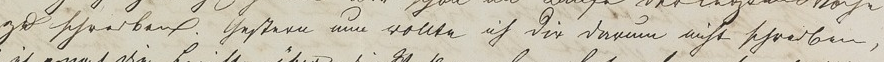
zu schreiben. Gestern nun wollte ich Dir darum nicht schreiben,
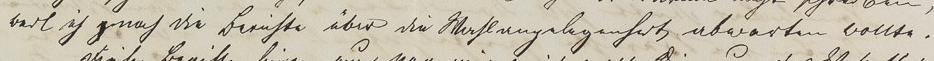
weil ich noch die Berichte über die Wahlangelegenheiten abwarten wollte.
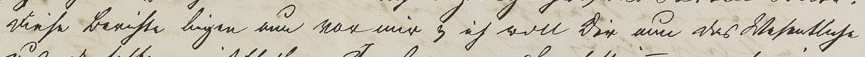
Diese Berichte liegen nun vor mir & ich will Dir nun das Wesentliche
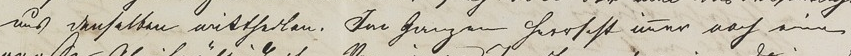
aus denselben mittheilen. Im Ganzen herrscht immer noch eine
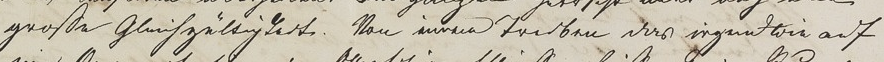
große Gleichgültigkeit. Von einem Treiben das irgendwie auf
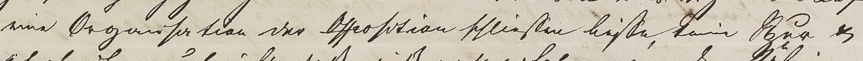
eine Organisation der Opposition schließen ließe, keine Spur &
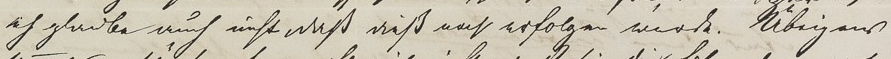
ich glaube auch nicht daß dieß noch erfolgen werde. Übrigens
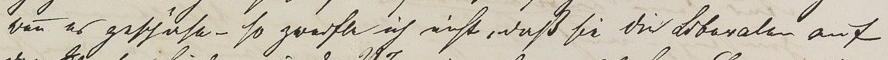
wenn es geschähe ­ so zweifle ich nicht, daß sie die Liberalen auf
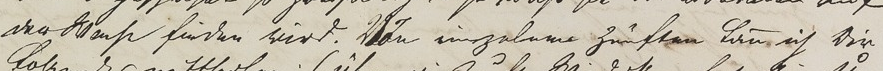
der Wache finden wird. Von einzelnen Zünften kann ich Dir
